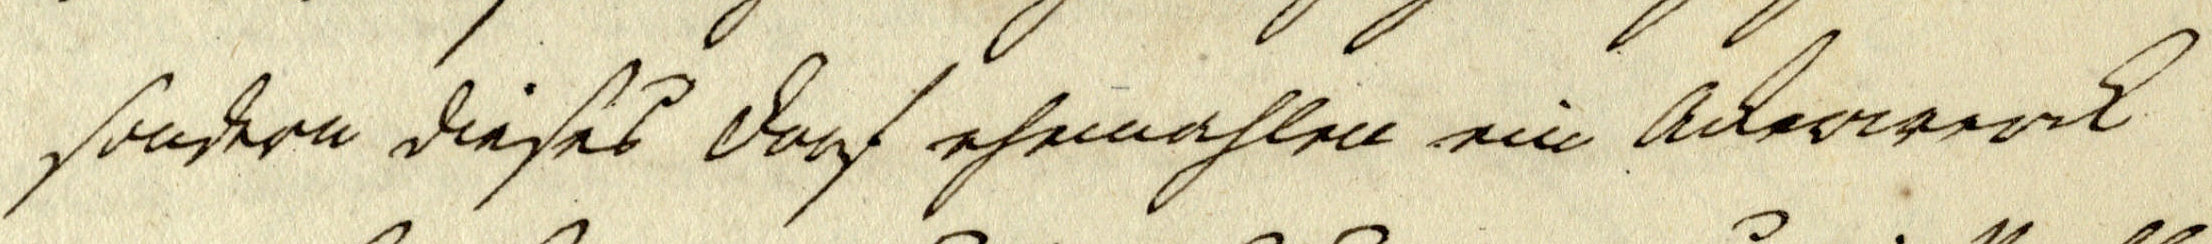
sondern dieses Dorf ehemahlen ein Ackerwerck
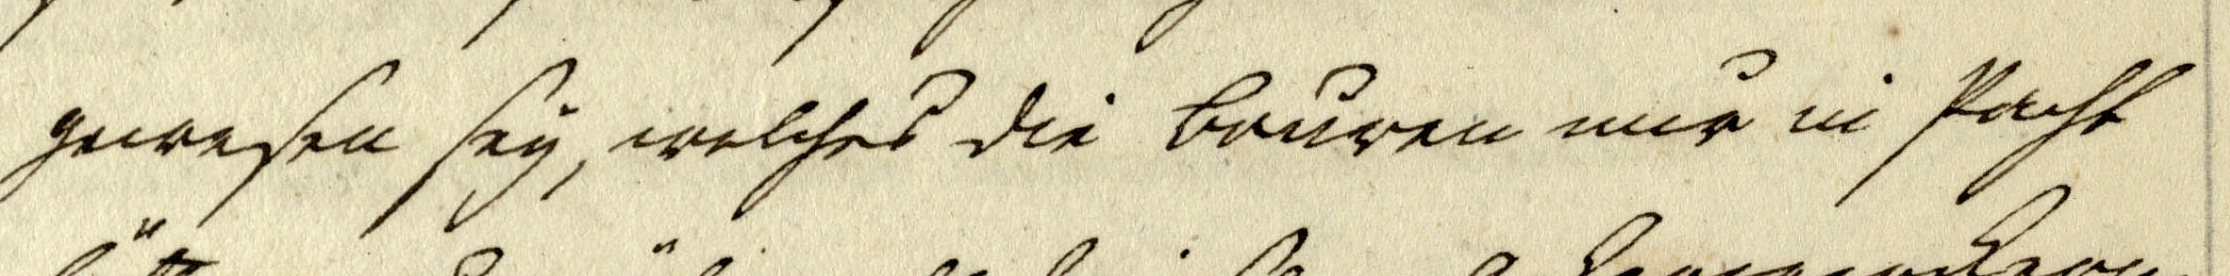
gewesen seÿ, welches die Bauren nur in Pacht
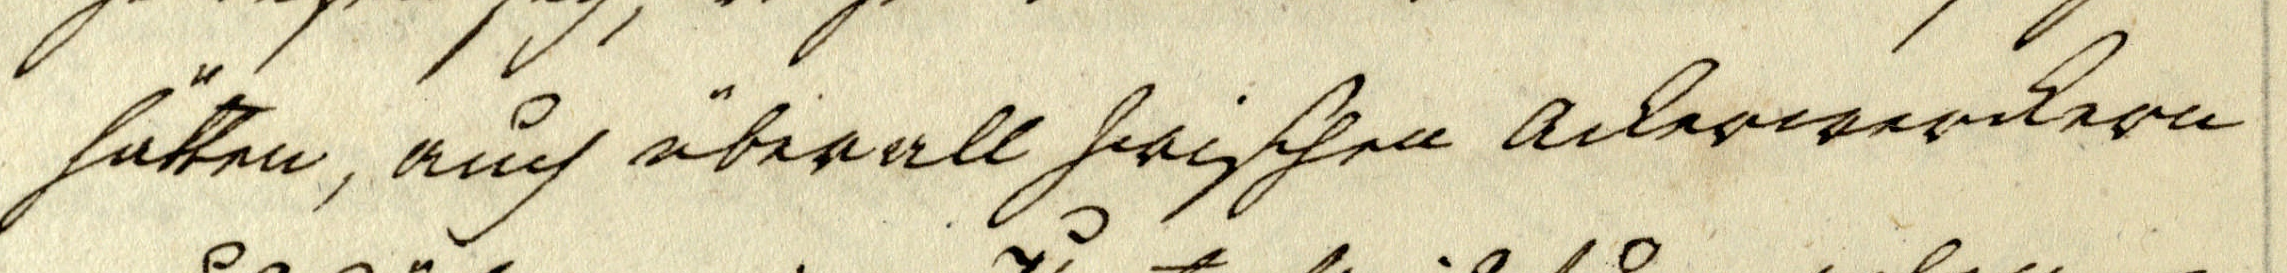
hätten, auch überall zwischen Ackerwerckern
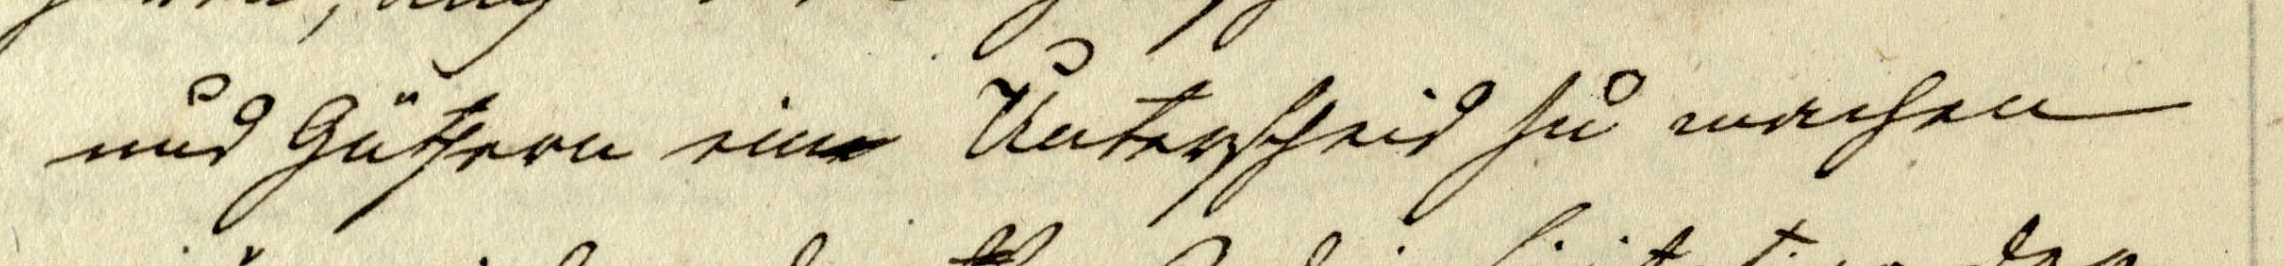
und Gütern ein Unterscheid zu machen
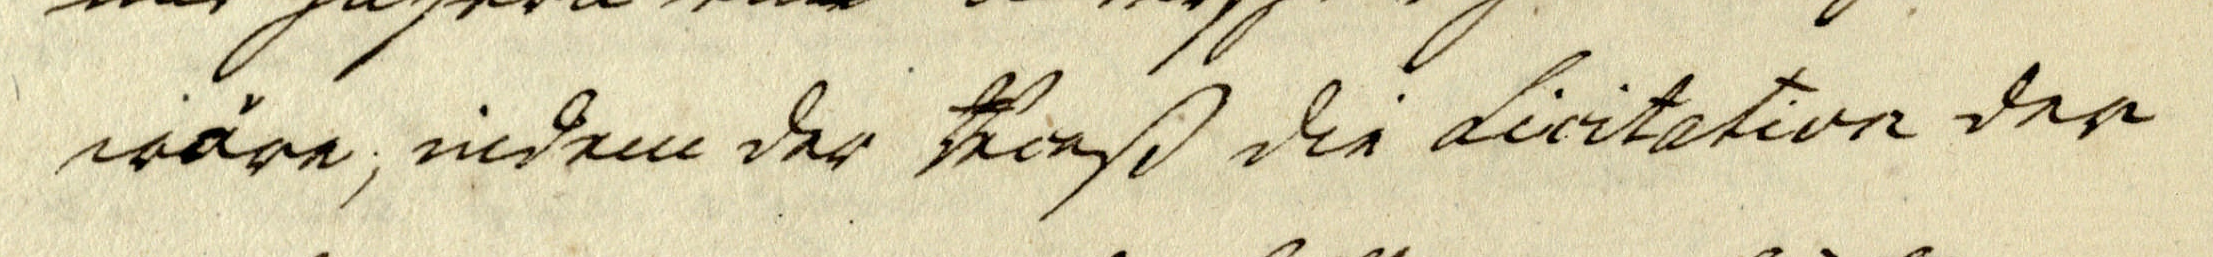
wäre, indem der Receß die Licitation der
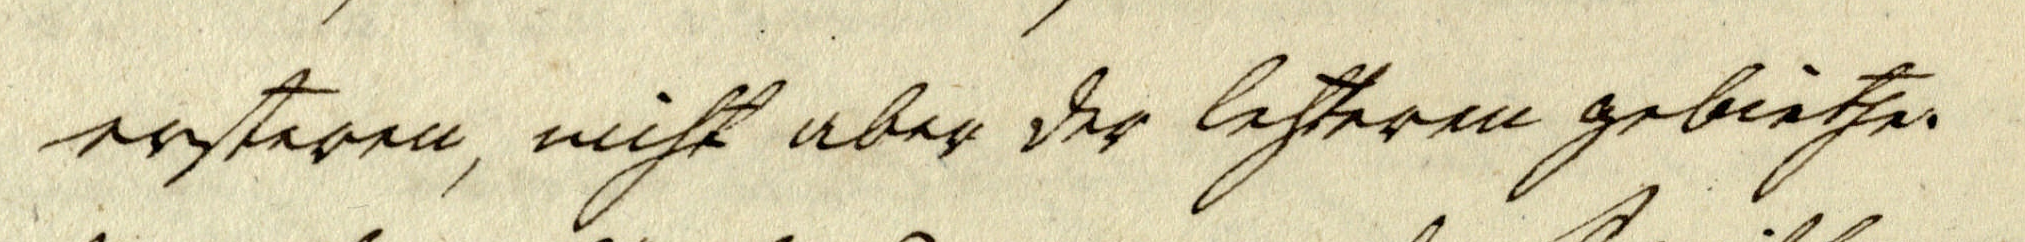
ersteren, nicht aber der letzteren gebiethe.
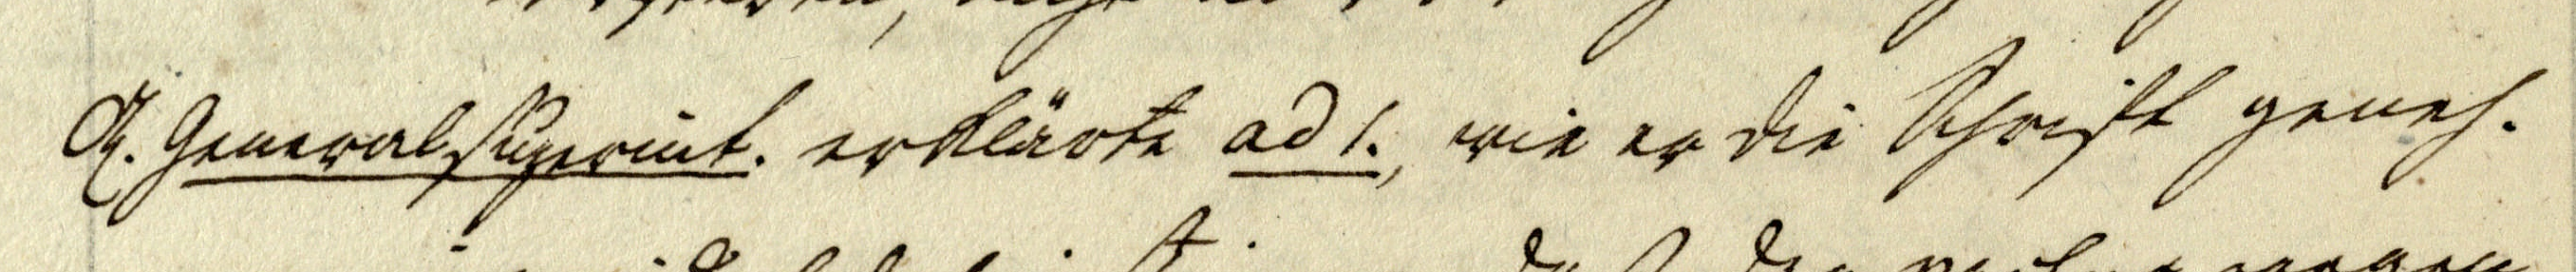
dh. Generalsuperint. erklärte ad 1., wie er die Schrift geneh¬
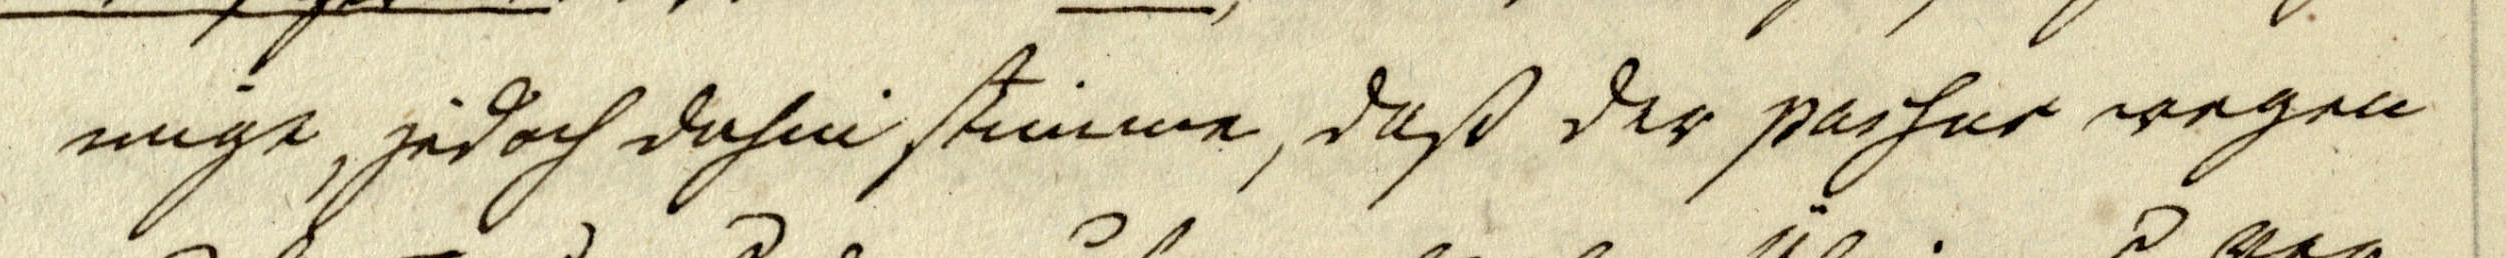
mige, jedoch dahin stimme, daß der passus wegen
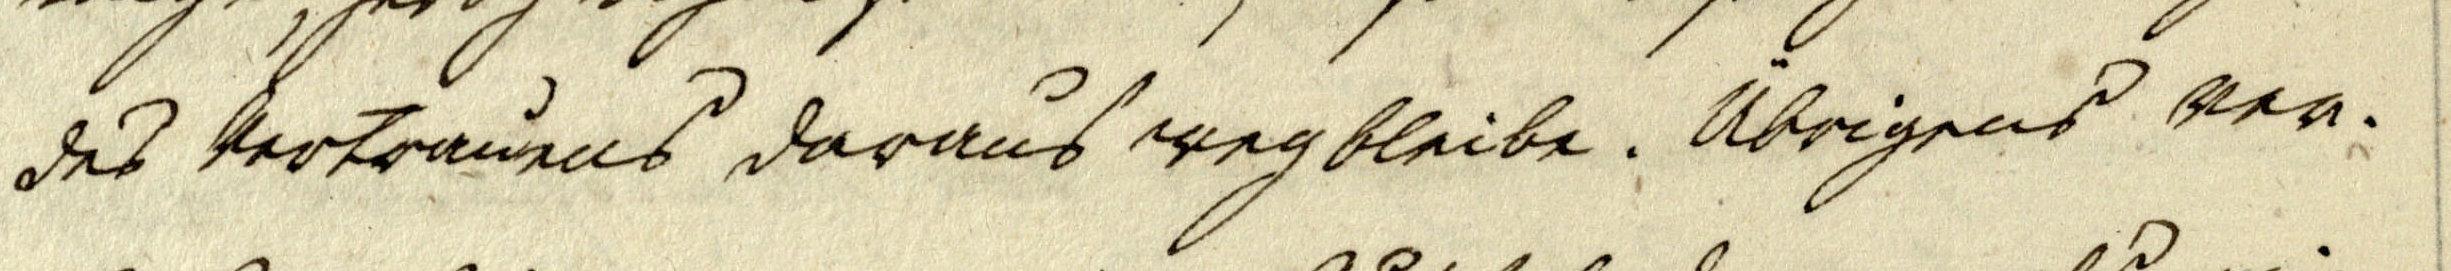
des Vertrauens daraus weg bleibe. Übrigens ver¬
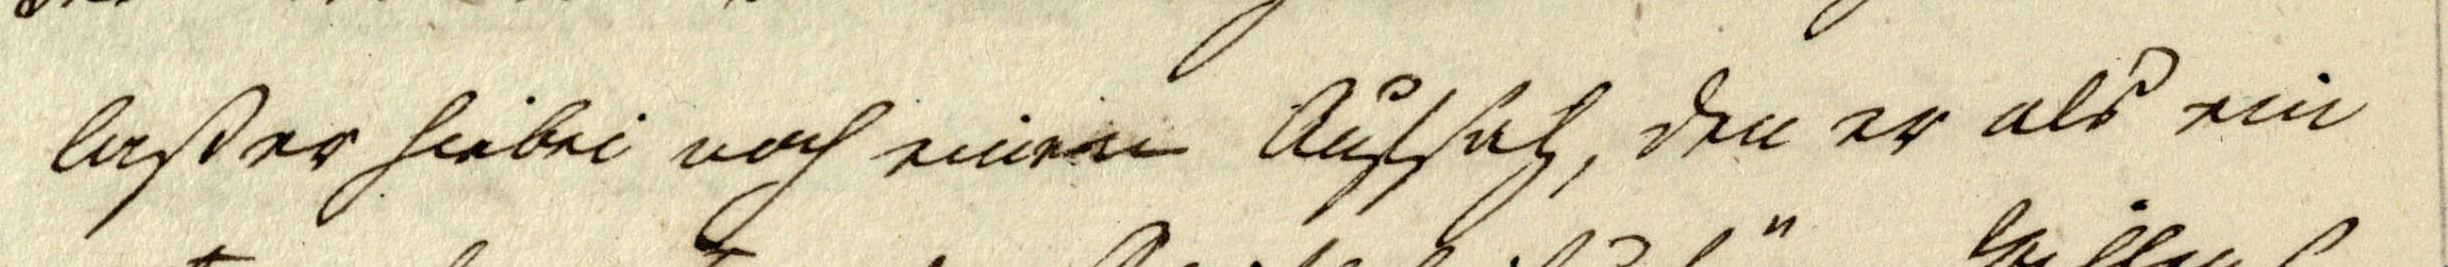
laß er hiebei noch einen Aufsatz, den er als ein
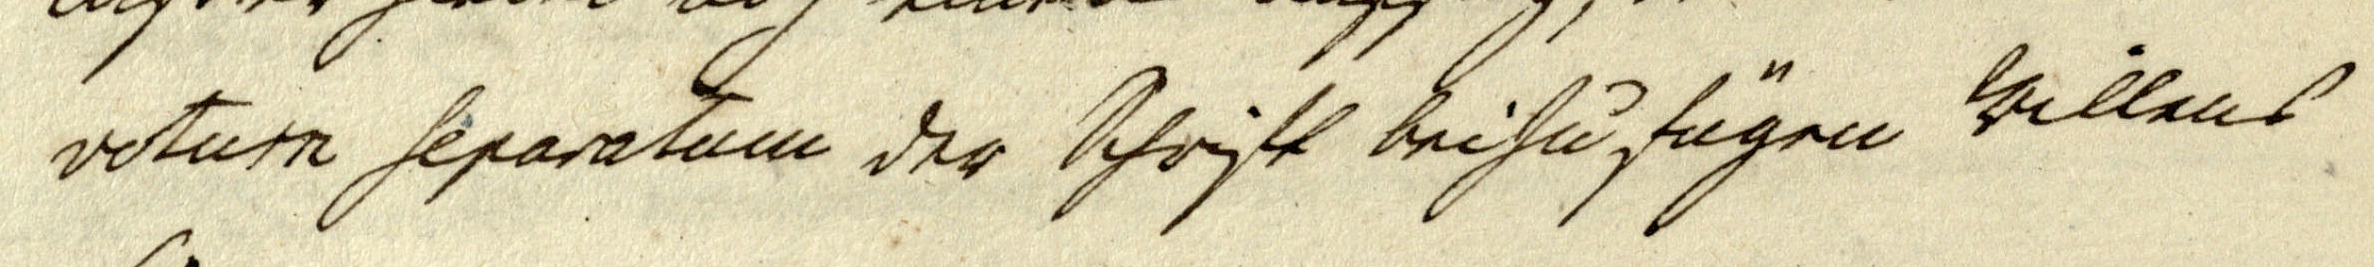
votum separatum der Schrift beizufügen Willens
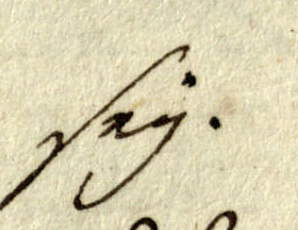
sei.
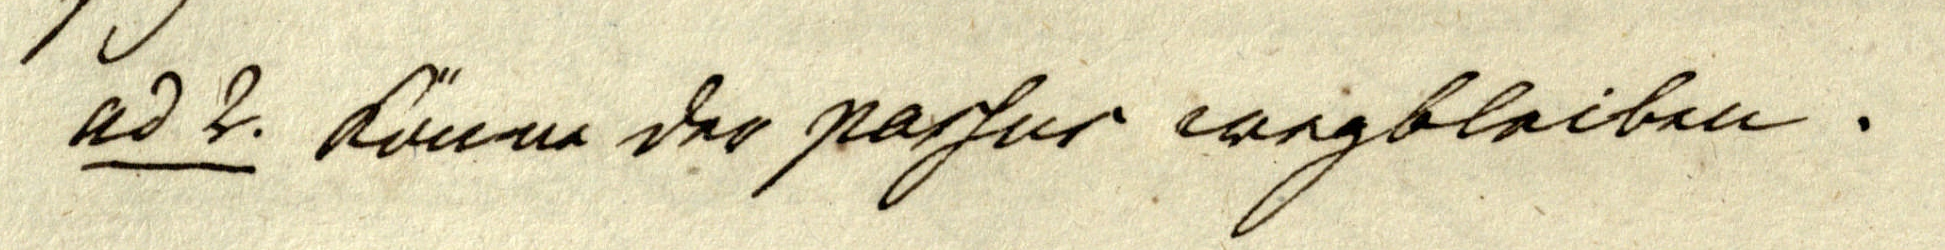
ad 2. könne der passus wegbleiben.
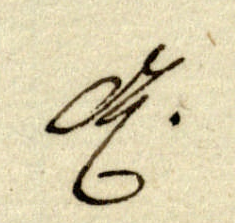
dh.
